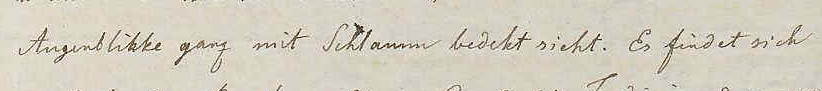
Augenblikke ganz mit Schlamm bedekt sieht. Es findet sich
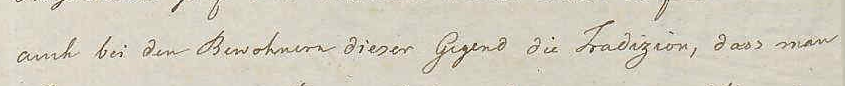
auch bei den Bewohnern dieser Gegend die Tradizion, dass man
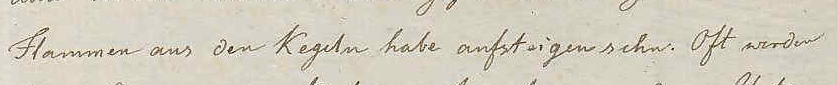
Flammen aus den Kegeln habe aufsteigen sehn. Oft werden
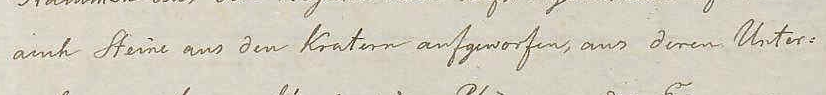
auch Steine aus den Kratern aufgeworfen, aus deren Unter-
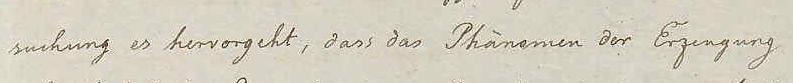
suchung es hervorgeht, dass das Phänomen der Erzeugung
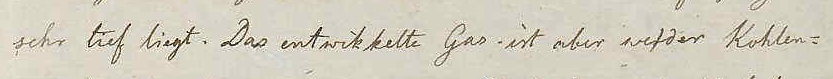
sehr tief liegt. Das entwikkelte Gas ist aber werder Kohlen-
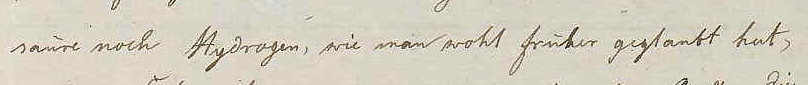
säure noch Hydrogen, wie man wohl früher geglaubt hat,
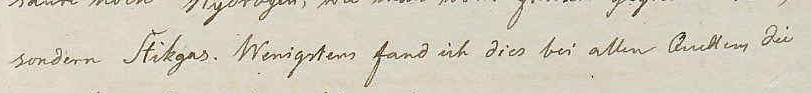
sondern Stikgas. Wenigstens fand ich dies bei allen Quellen, die
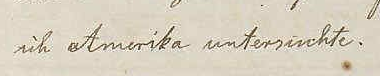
ich Amerika untersuchte.
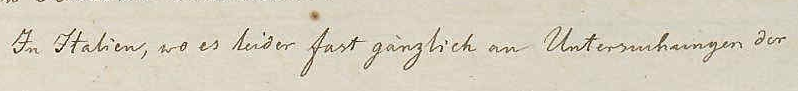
In Italien, wo es leider fast gänzlich an Untersuchungen der
